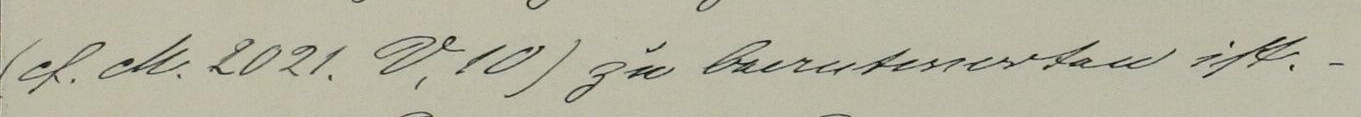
(cf. M.2021. V.10) zu beantworten ist.
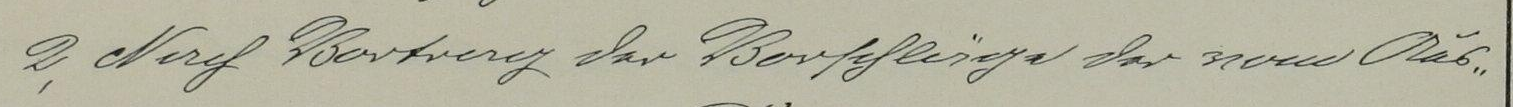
2. Nach Vortrag der Vorschläge der vom Aus-
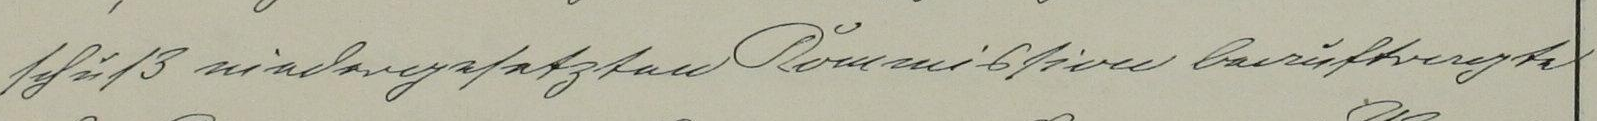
schuß niedergesetzten Kommission beauftragte
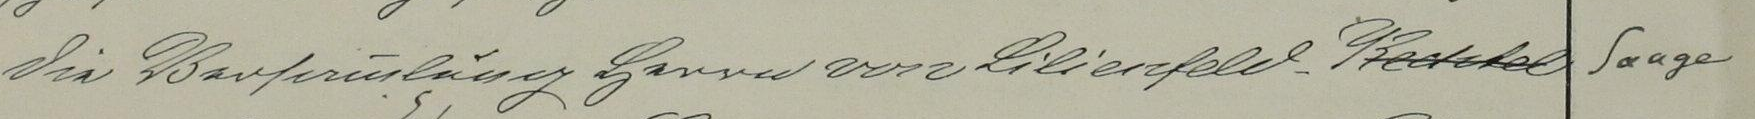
die Versammlung Herrn von Lilienfeld-Kechtel Saage,
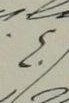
E.
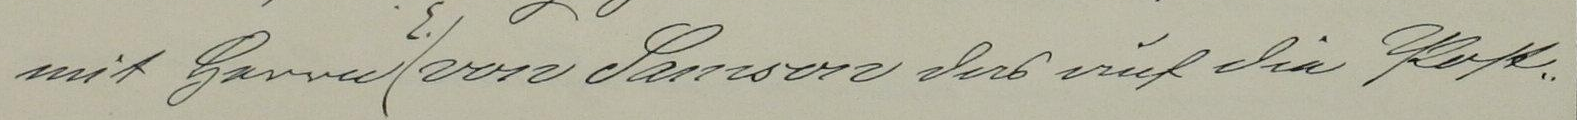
mit Herrn von Samson das auf die Post-
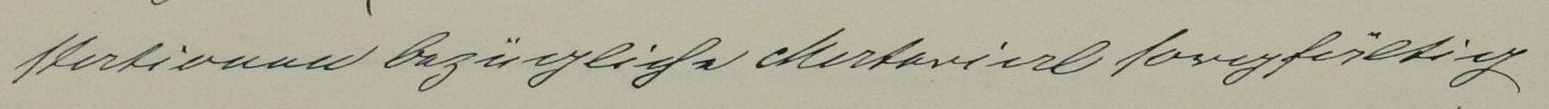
stationen bezügliche Material sorgfältig
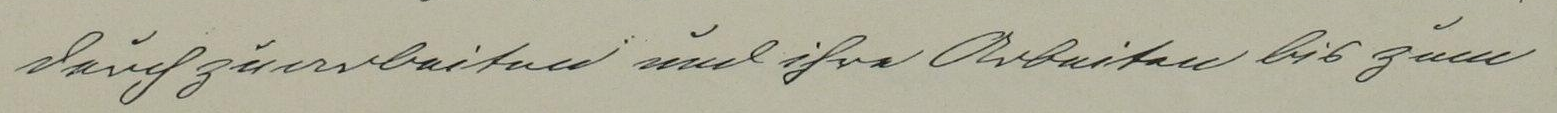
durchzuarbeiten und ihre Arbeiten bis zum
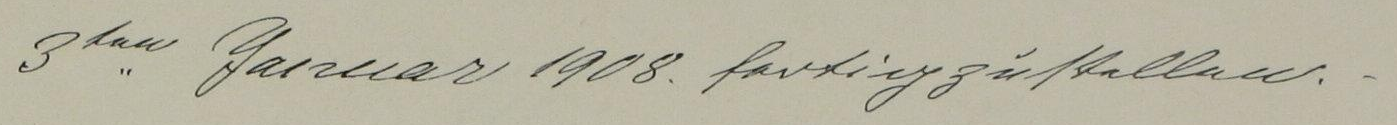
3ten Januar 1908. fertigzustellen.
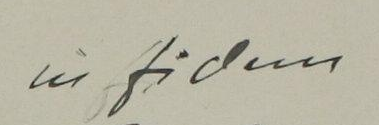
in fidem
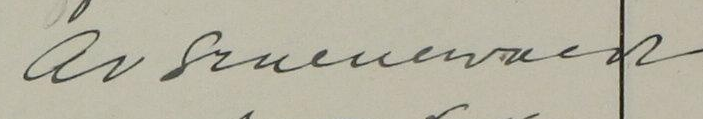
Av Gruenewaldt
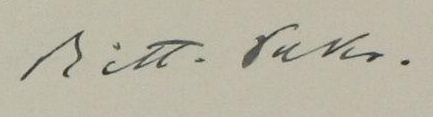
Ritt. Sekr.
